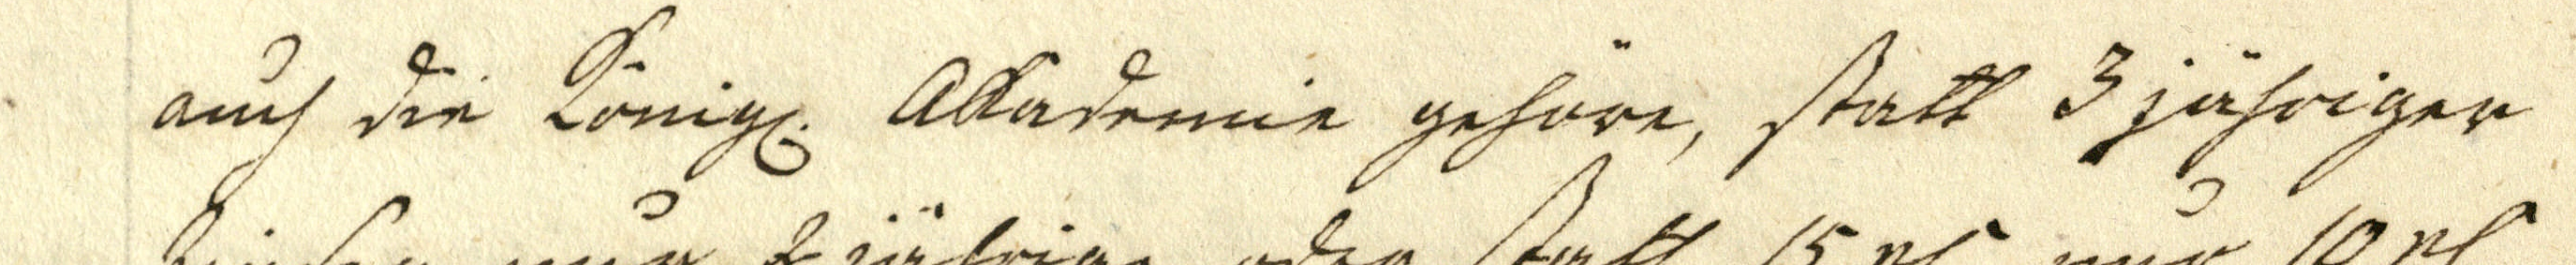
auch die Königl. Akademie gehöre, statt 3 jähriger
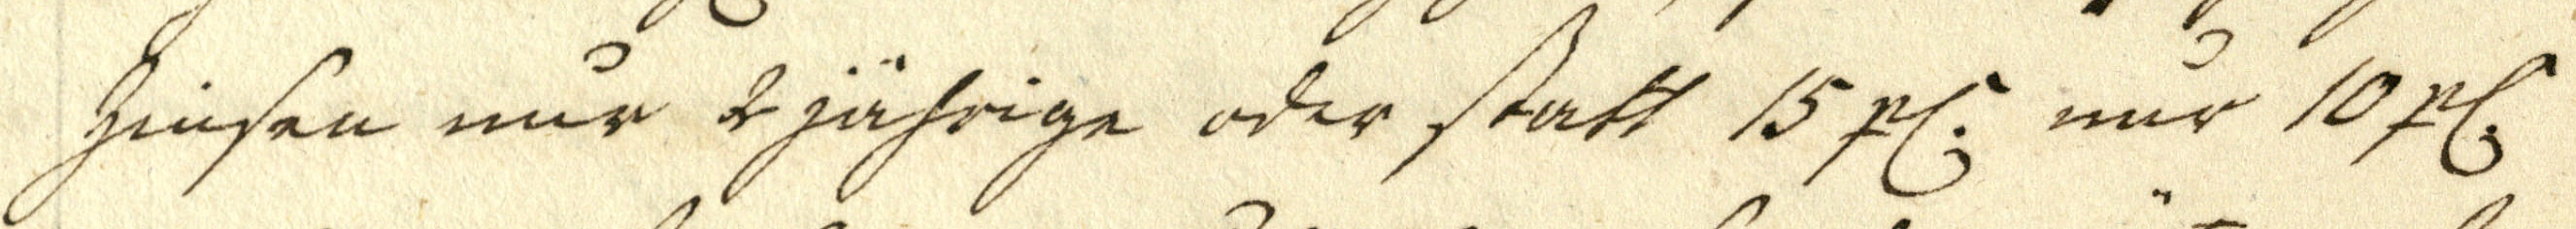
Zinsen nur 2 jährige oder statt 15 pl. nur 10 pl.
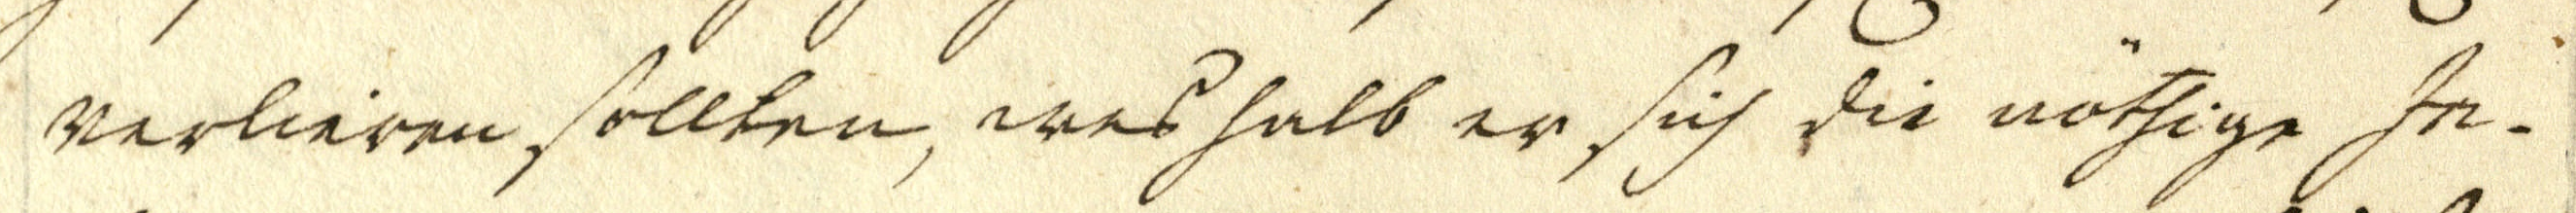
verlieren sollten, weshalb er sich die nöthige In¬
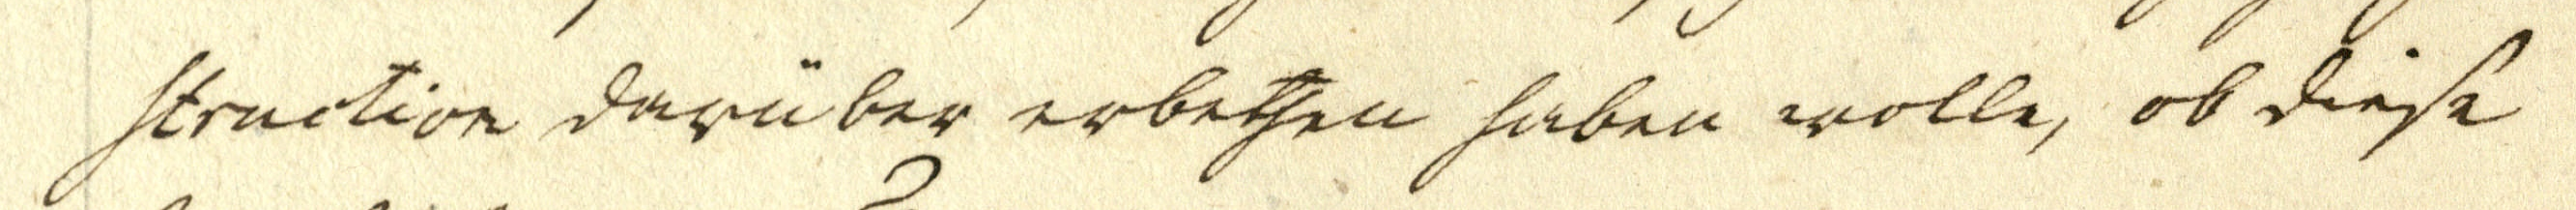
struction darüber erbethen haben wolle, ob diese
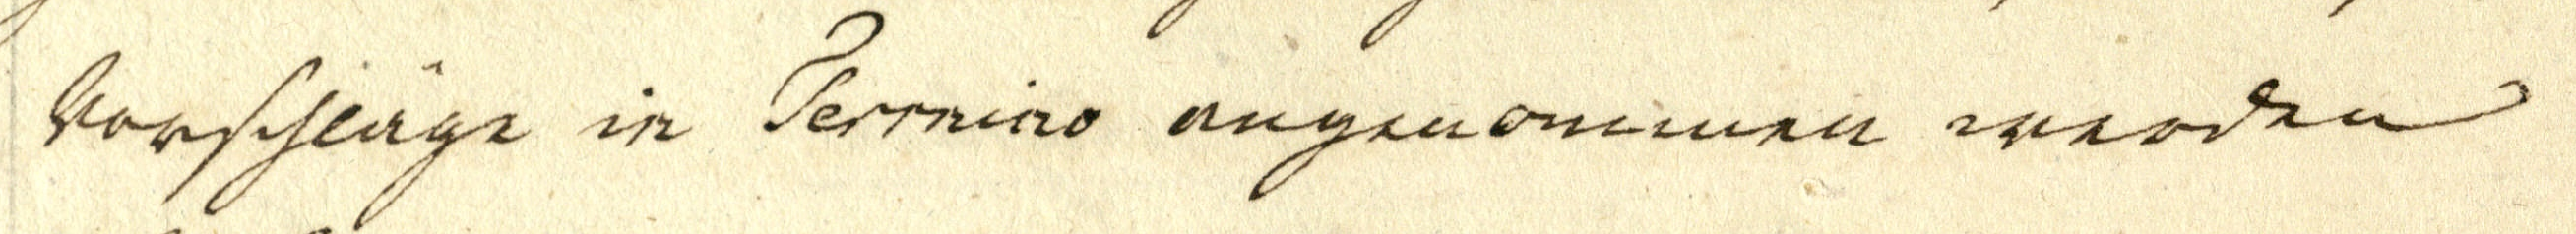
Vorschläge in Termino angenommen werden
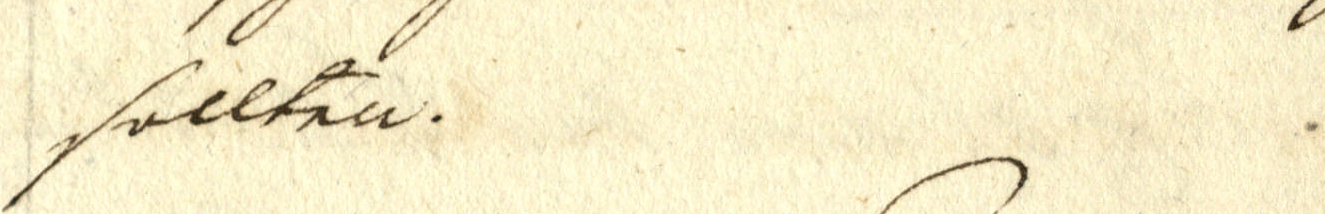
sollten.
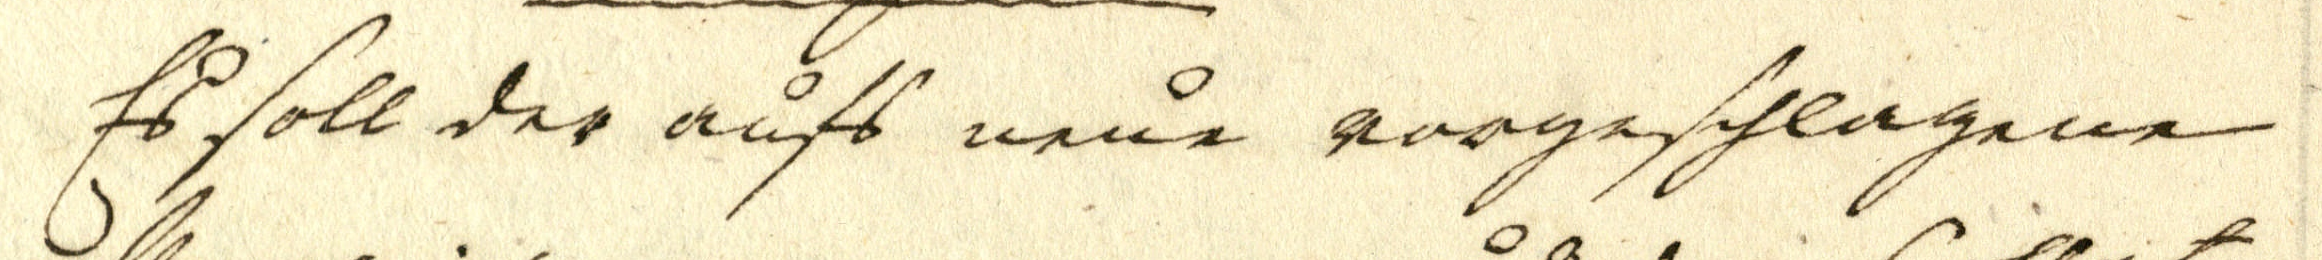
Es soll der aufs neue vorgeschlagene
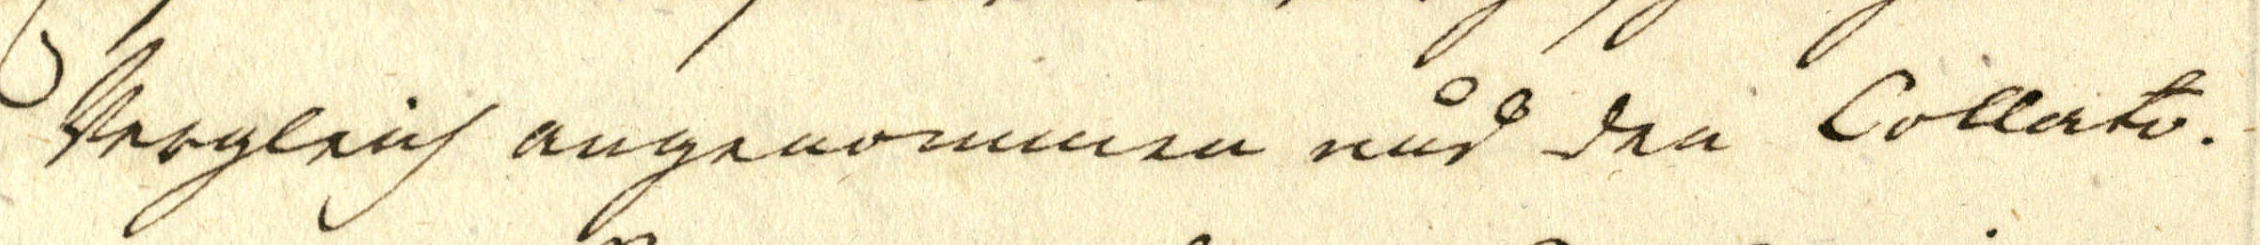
Vergleich angenommen und den Collato¬
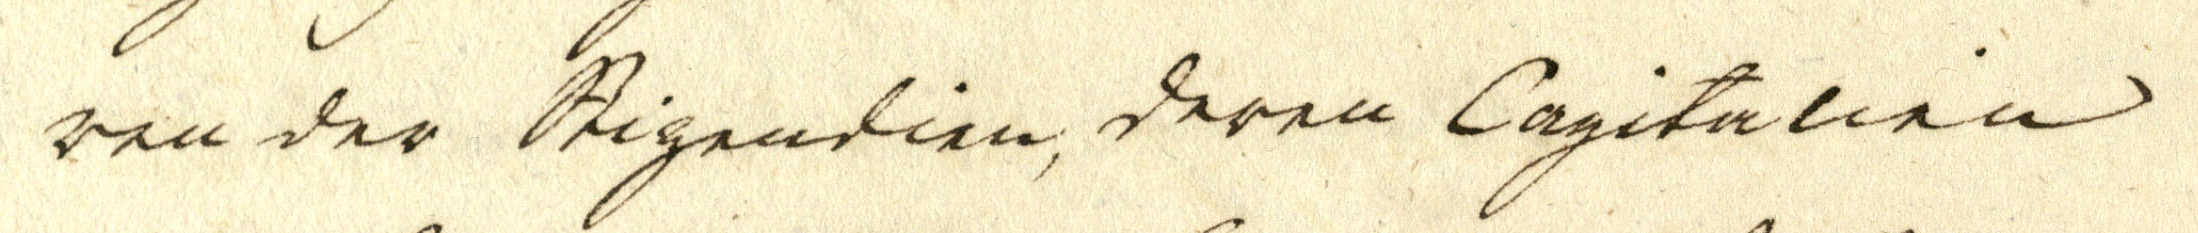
ren der Stipendien, deren Capitalien
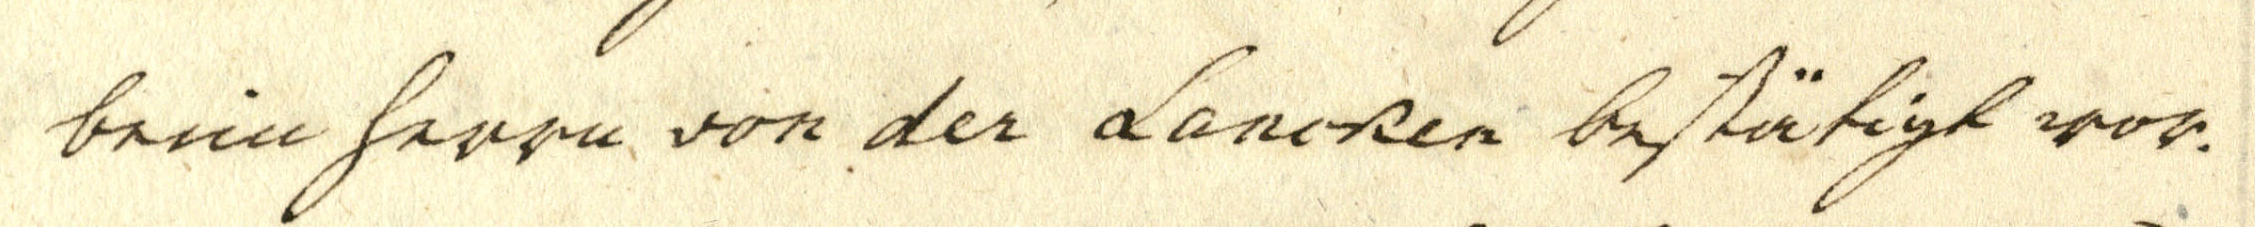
beim herrn von der Lancken bestätigt wor¬
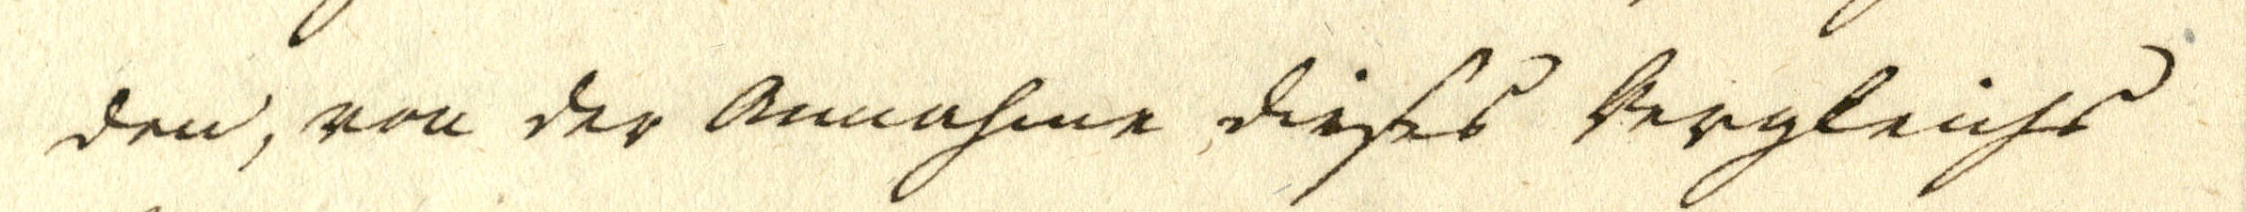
den, von der Annahme dieses Vergleichs
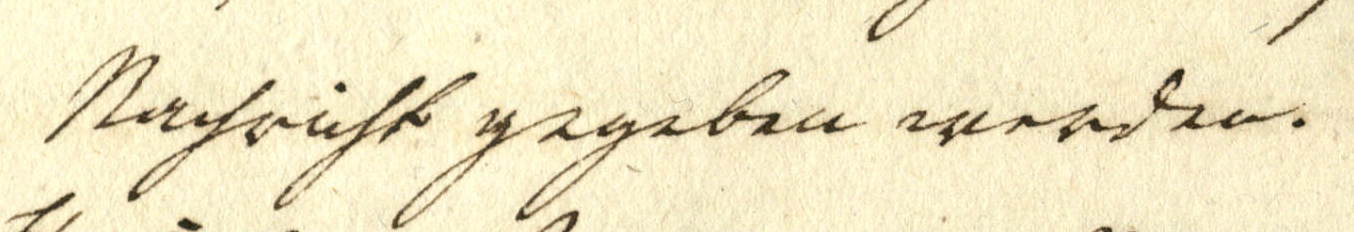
Nachricht gegeben werden.
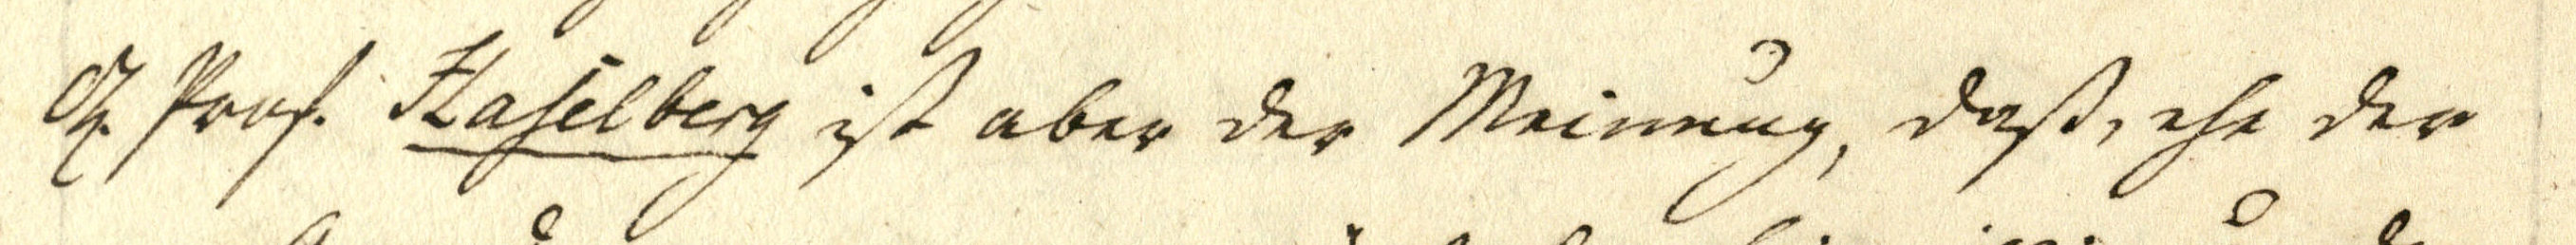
dh. Prof. Haselberg ist aber der Meinung, daß, ehe der
